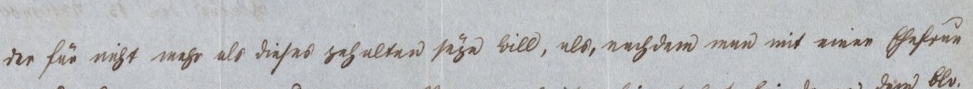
der für nicht mehr als dieses gehalten seyn will, als, nachdem man mit einer Ehefrau
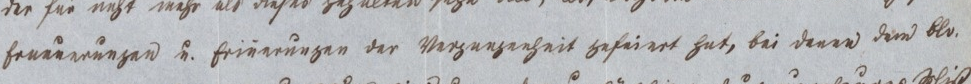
Erneuerungen u. Erinnerungen der Vergangenheit gefeiert hat, bei denen dem blo-
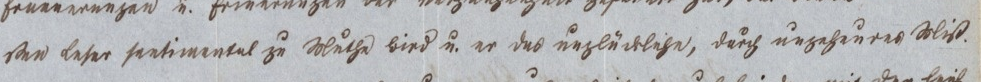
ßen Leser sentimental zu Muthe wird u. er das unglückliche, durch ungeheures Miß-
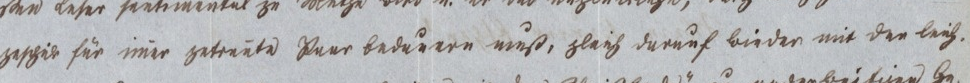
geschick für immer getrennte Paar bedauern muß, gleich darauf wieder mit der leich-
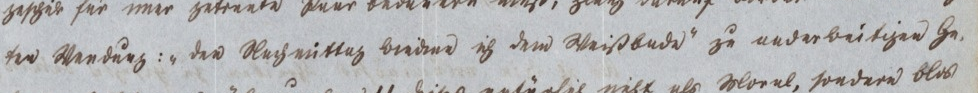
ten Wendung: «den Nachmittag wiedme ich dem Weißbade» zu anderweitigen Ge-
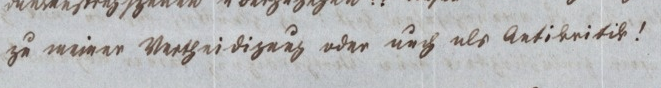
zu meiner Vertheidigung oder auch als Antikritik!
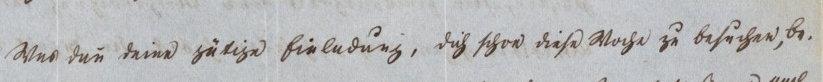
Was dann deine gütige Einladung, dich schon diese Woche zu besuchen, be-
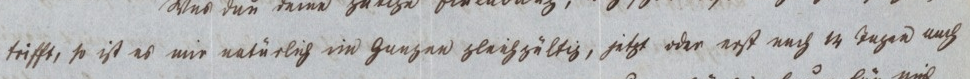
trifft, so ist es mir natürlich im Ganzen gleichgültig, jetzt oder erst nach 14 Tagen nach
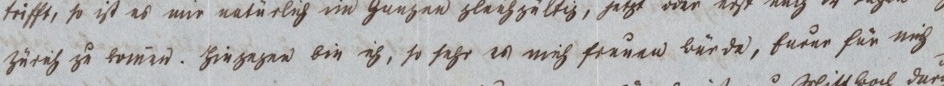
Zürich zu kommen. Hingegen bin ich, so sehr es mich freuen würde, Eurer für mich
